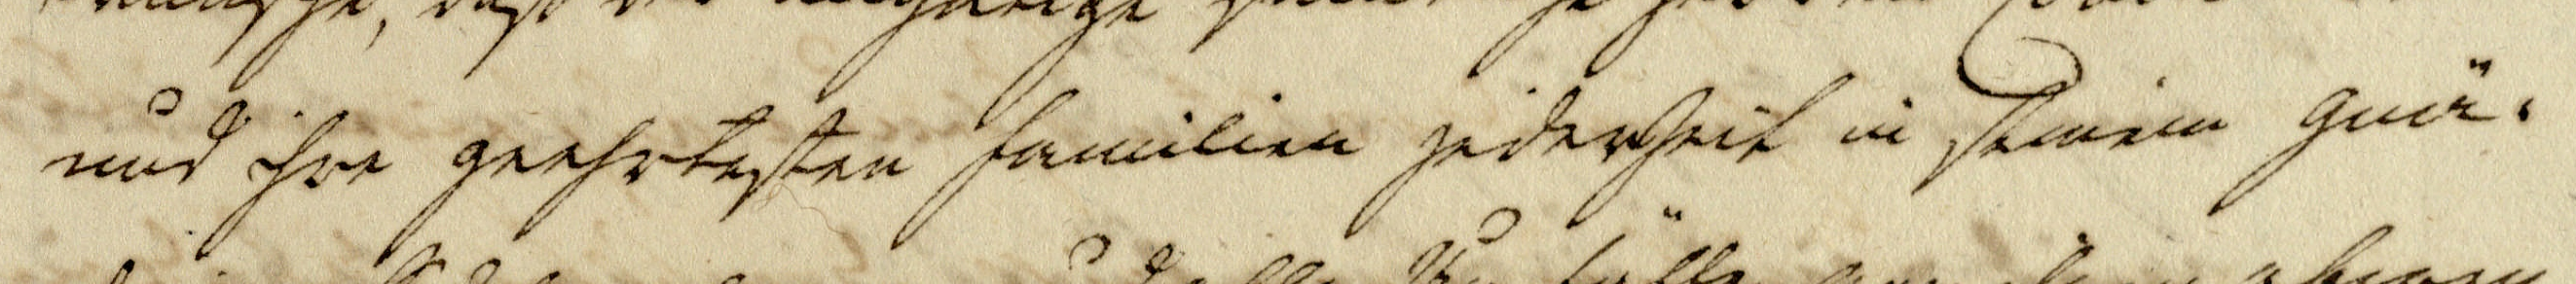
und ihre geehrtesten Familien jederzeit in seinem gnä¬
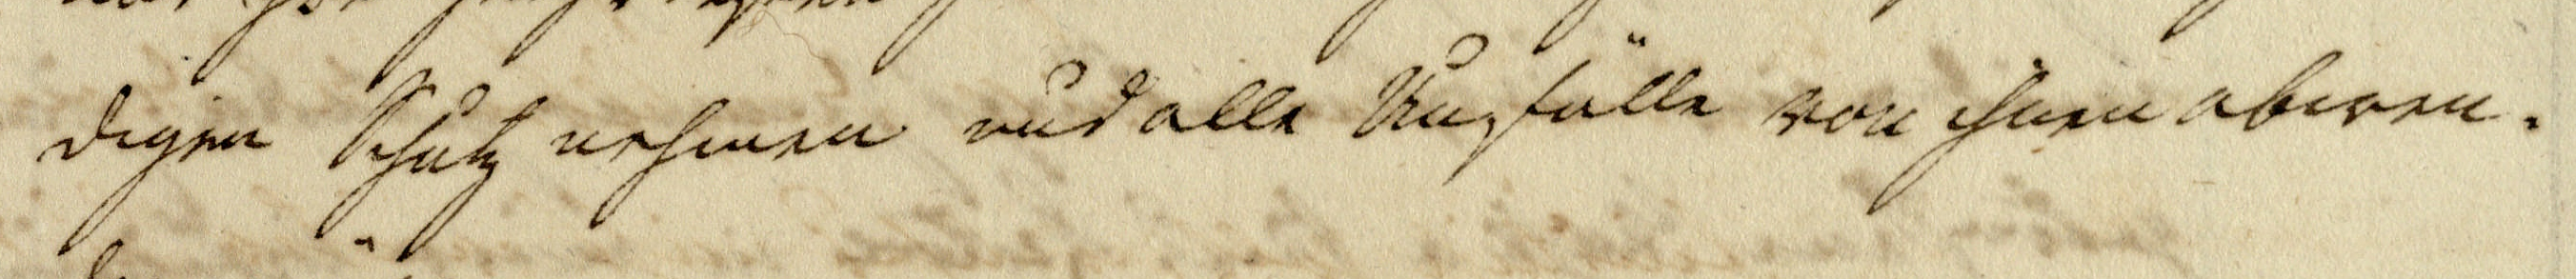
digen Schutz nehmen und alle Unfälle von ihnen abwen¬
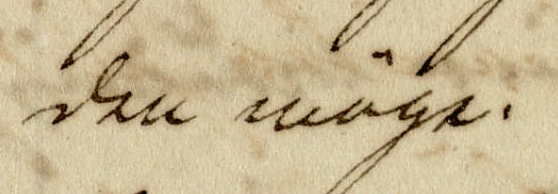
den möge.
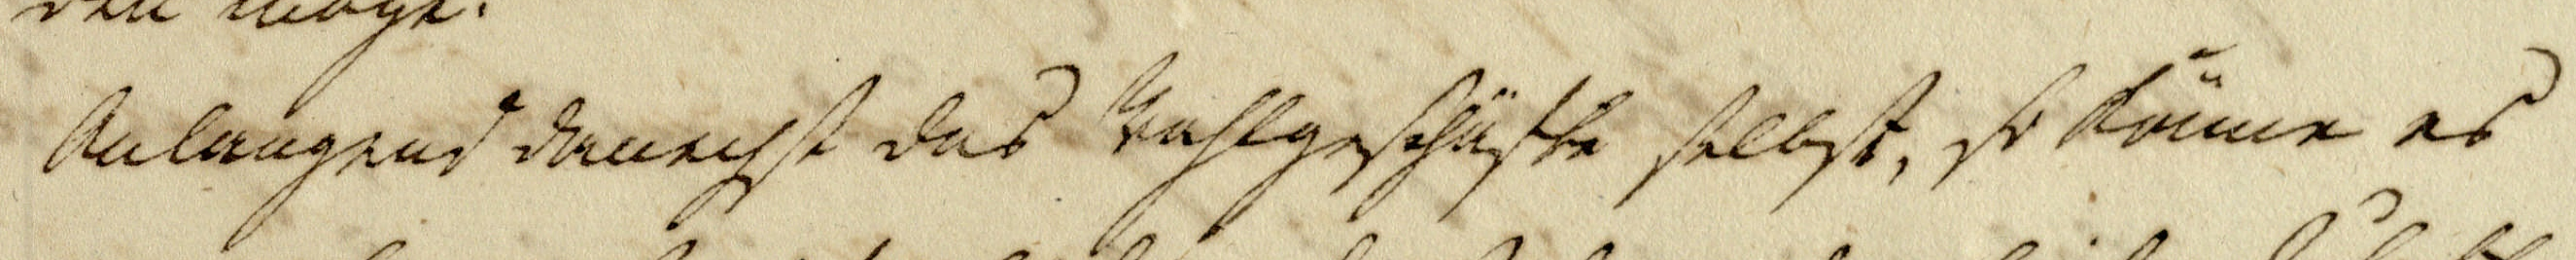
Anlangend danechst das Wahlgeschäfte selbst, so könne es
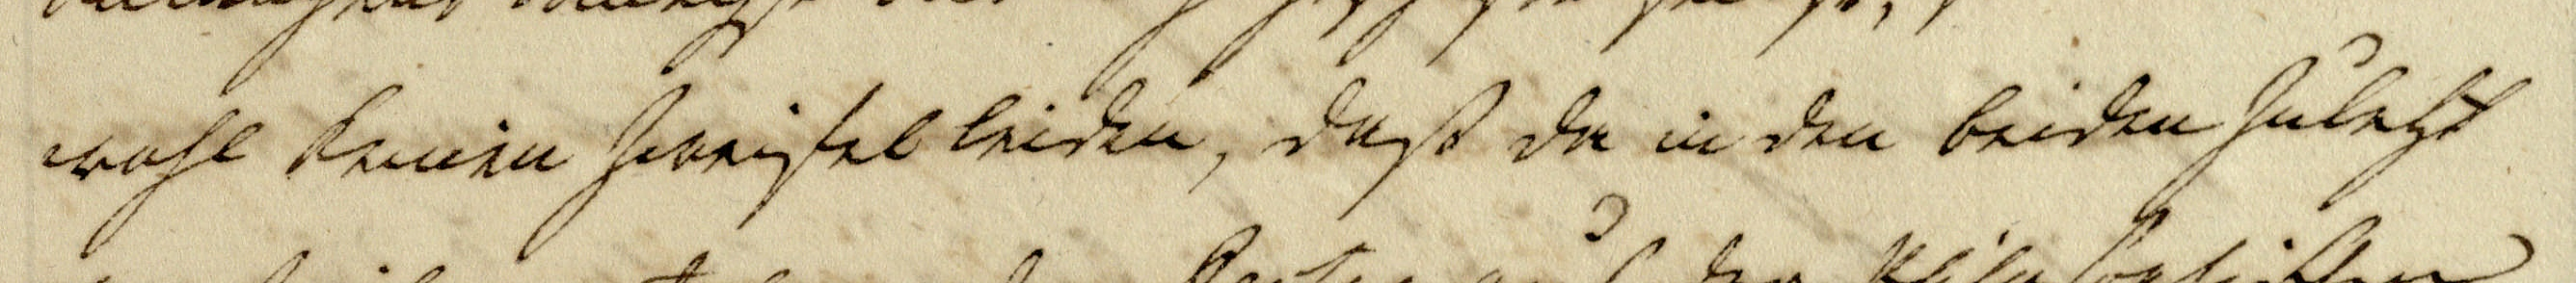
wohl keinen Zweifel leiden, daß da in den beiden zuletzt
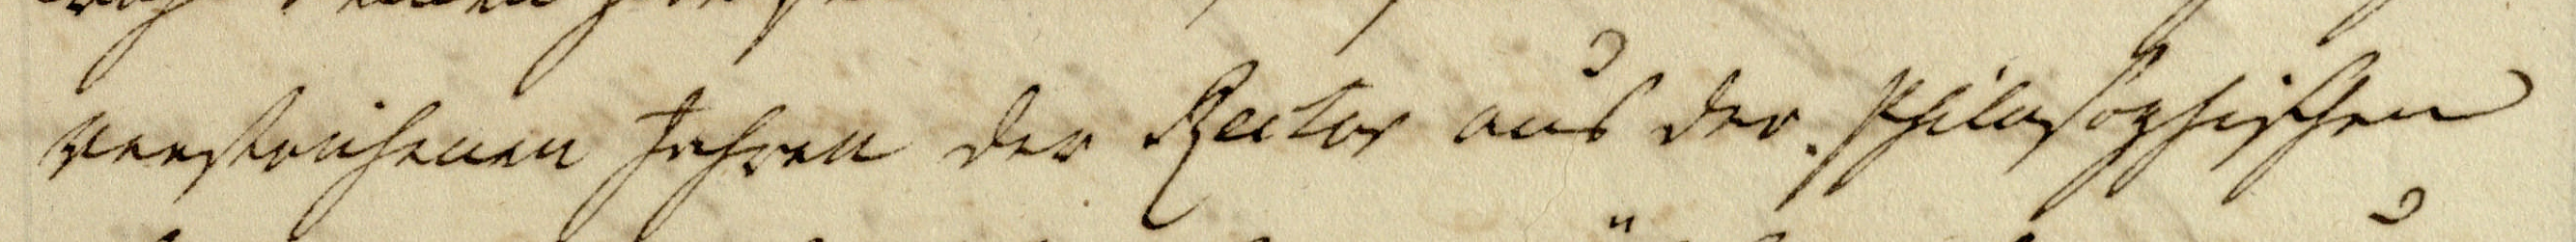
verstrichenen Jahren der Rector aus der Philosophischen
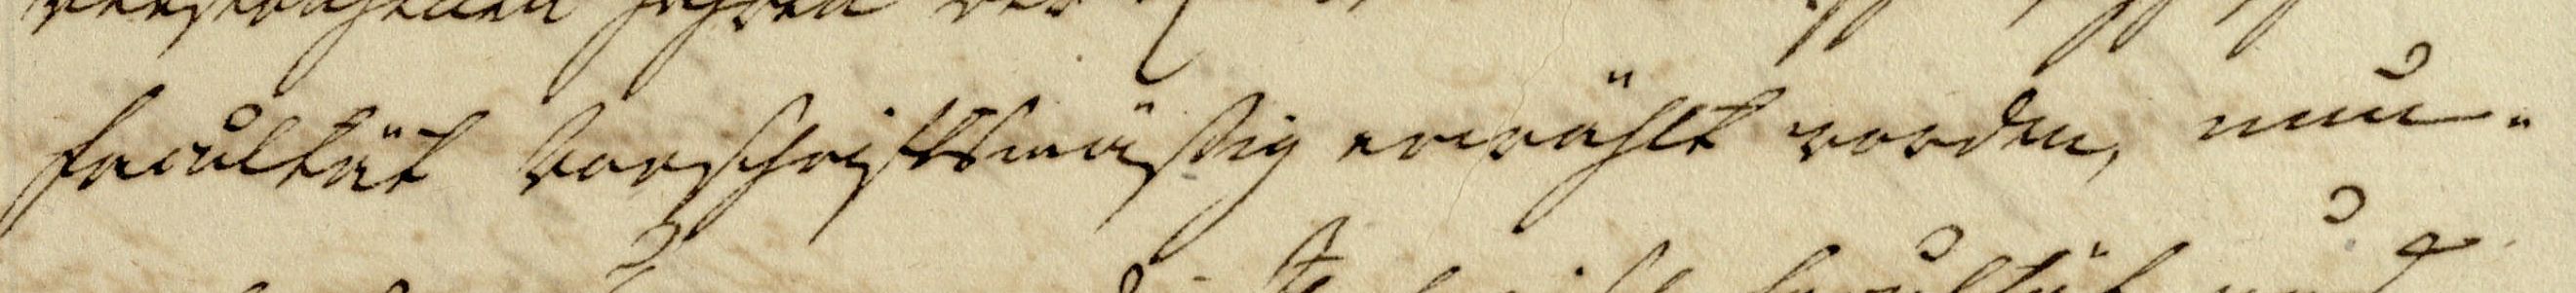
Facultät vorschriftsmäßig erwählt worden, nun¬
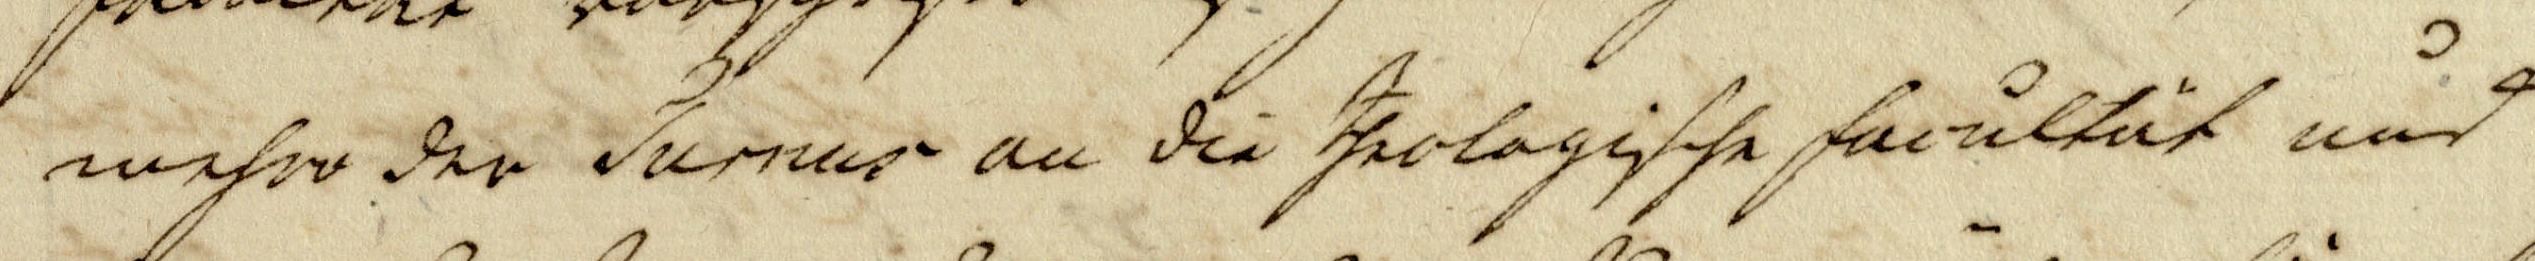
mehro der Turnus an die Theologische Facultät und
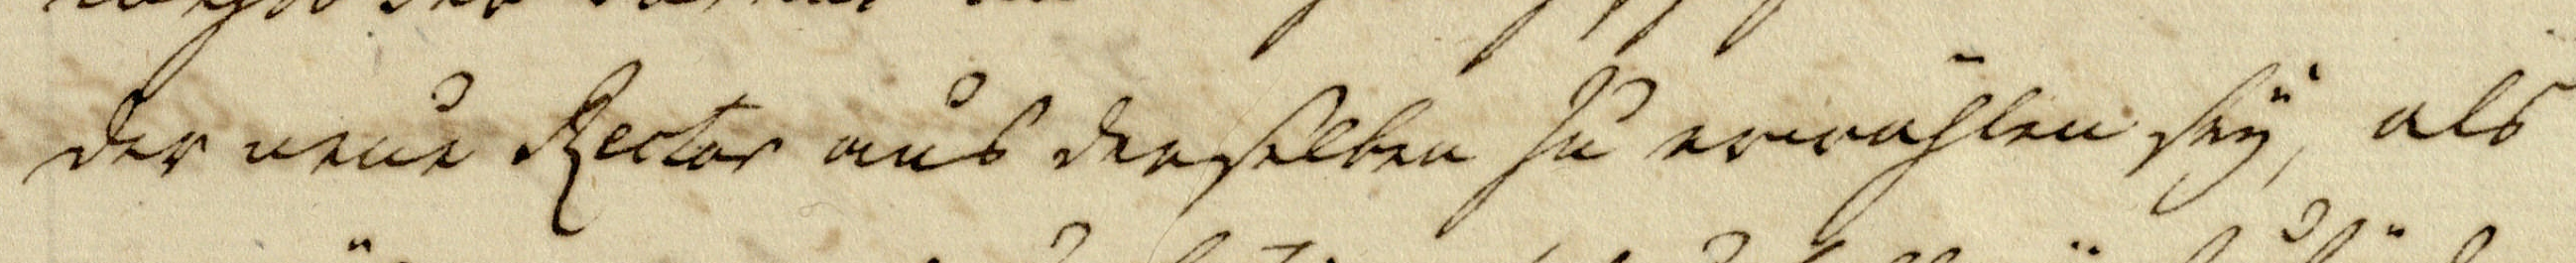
der neue Rector aus derselben zu erwählen seÿ, als
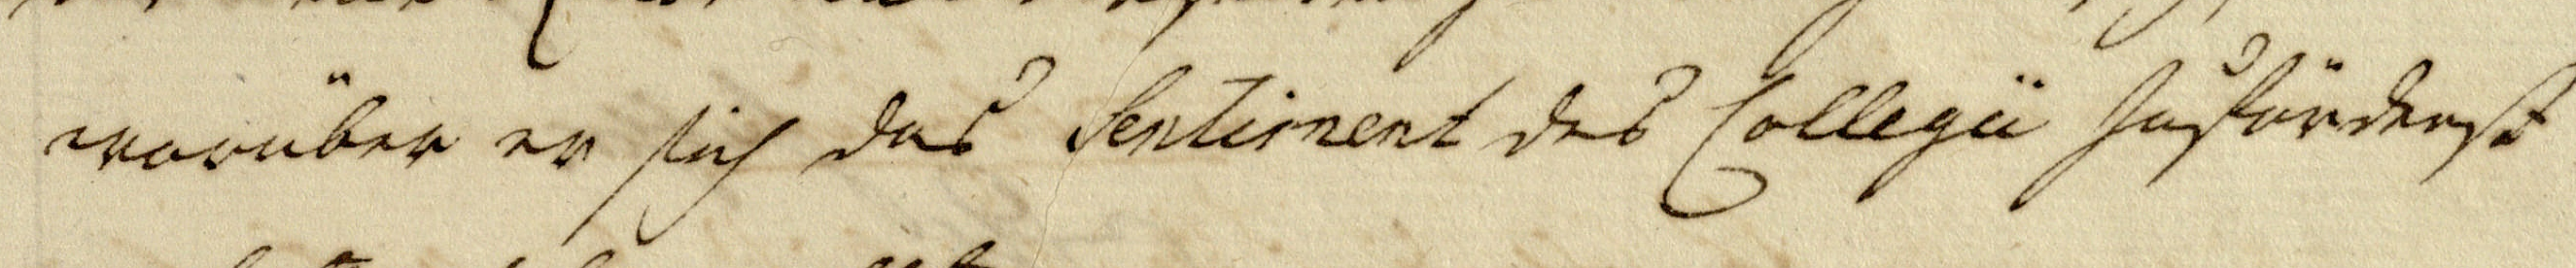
worüber er sich das Sentiment des Collegii zuförderst
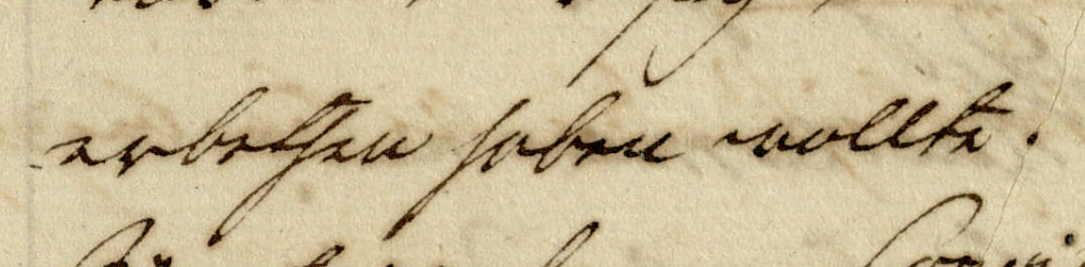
erbethen haben wollte.
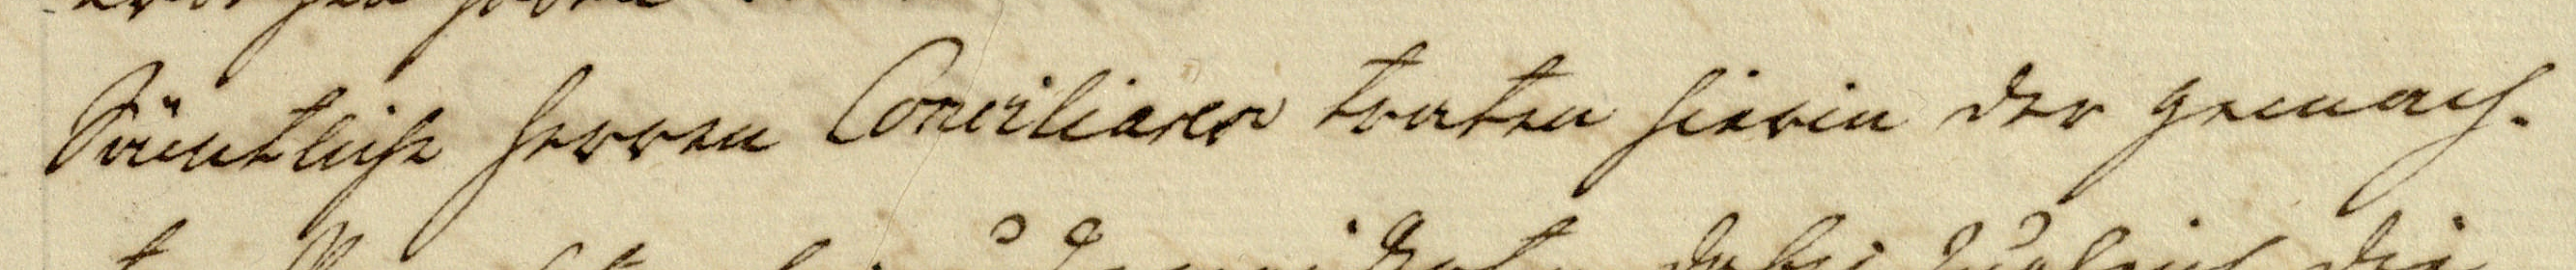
Sämtliche Herren Conciliares traten hierin der gemach¬
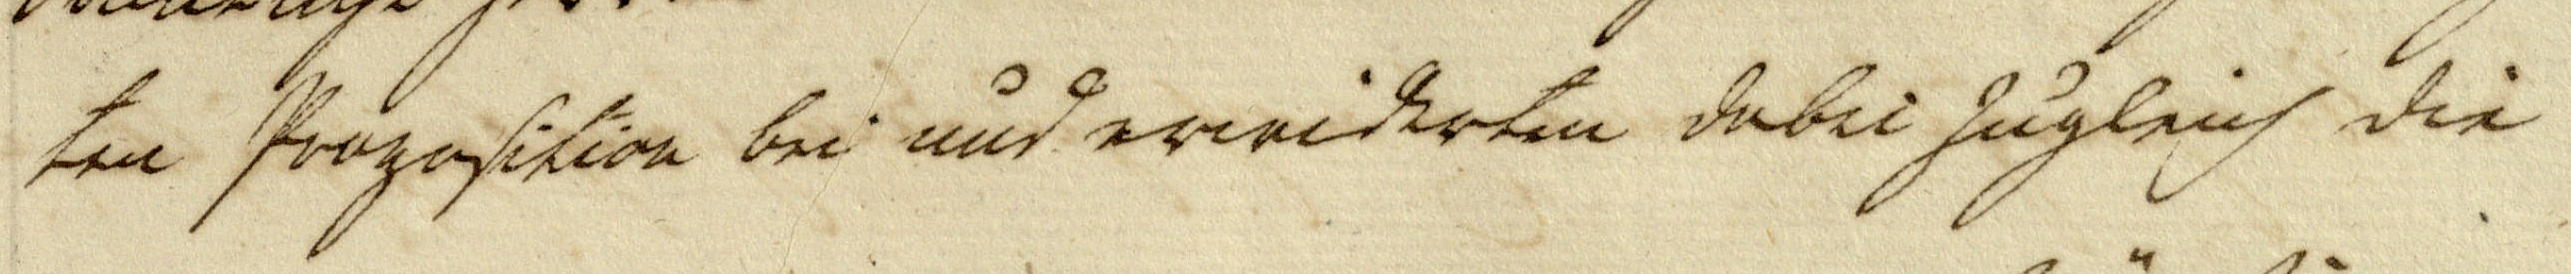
ten Proposition bei und erwiderten dabei zugleich die
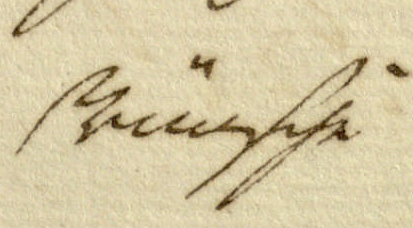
Wünsche
